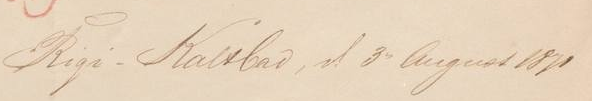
Rigi-Kaltbad, d 3 August 1871
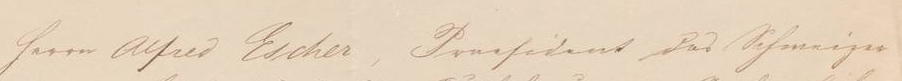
Herr Alfred Escher, Praesident des Schweizer
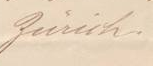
Zürich.
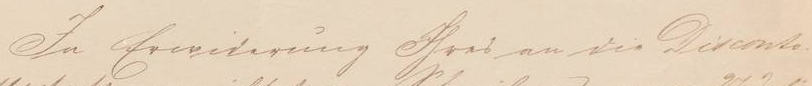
In Erwiderung Ihres an die Disconto-
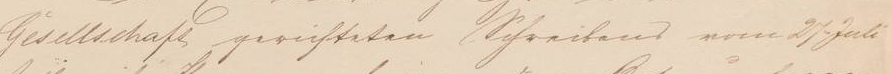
Gesellschaft gerichteten Schreiben vom 27 Juli
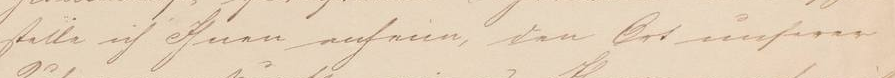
stelle ich Ihnen anheim, den Ort unserer
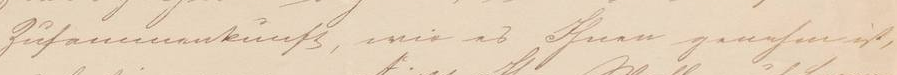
Zusammenkunft, wie es Ihnen genehm ist,
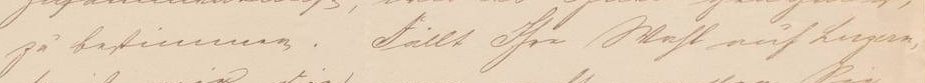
zu bestimmen. Fällt Ihre Wahl auf Luzern,
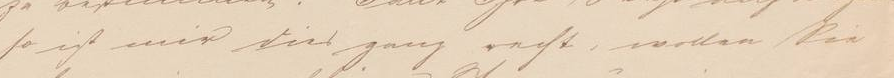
so ist mir dies ganz recht, wollen Sie
